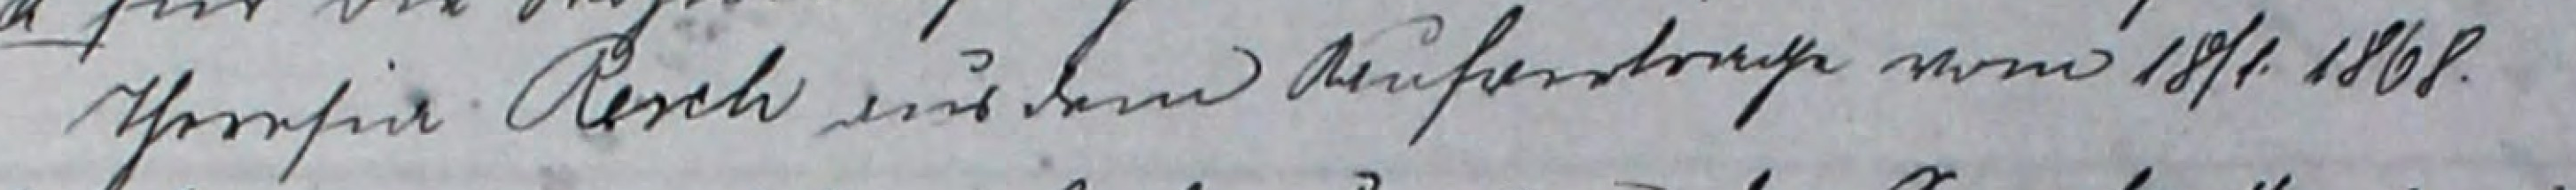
Theresia Resch aus dem Kaufvertrage vom 18/1. 1868.
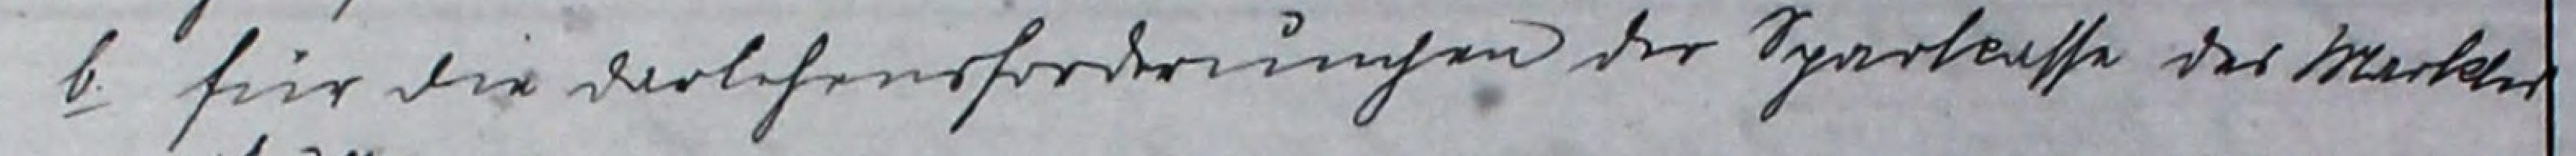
b. für die Darlehensforderungen der Sparkasse des Marktes
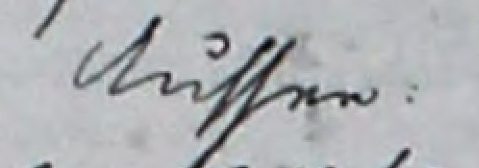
Aussee:
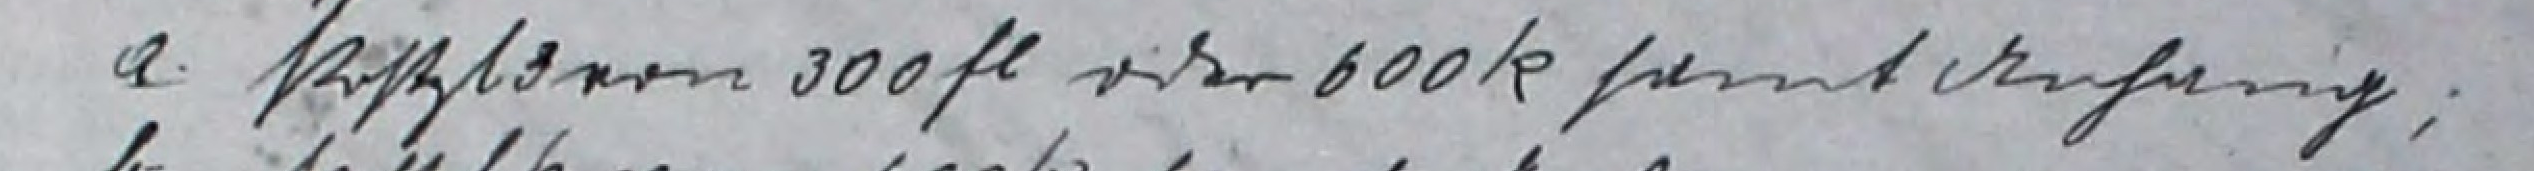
a. Postzl 3 von 300 fl oder 600 k samt Anhang;
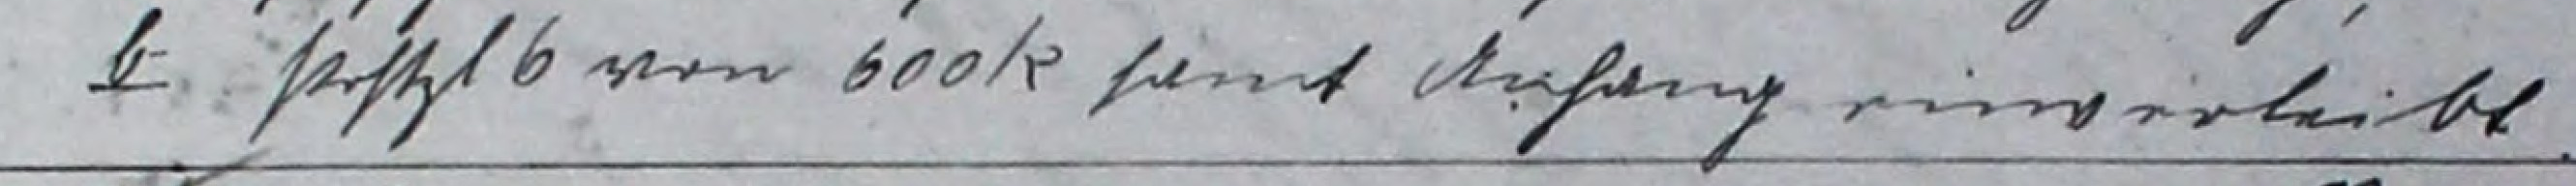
b. Postzl 6 von 600 k samt Anhang einverleibt.
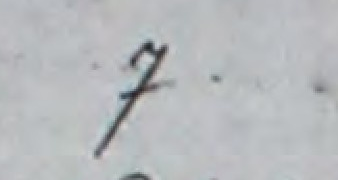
7
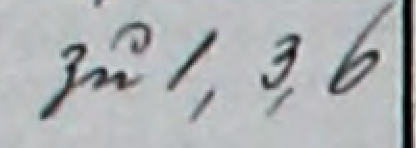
zu 1, 3, 6
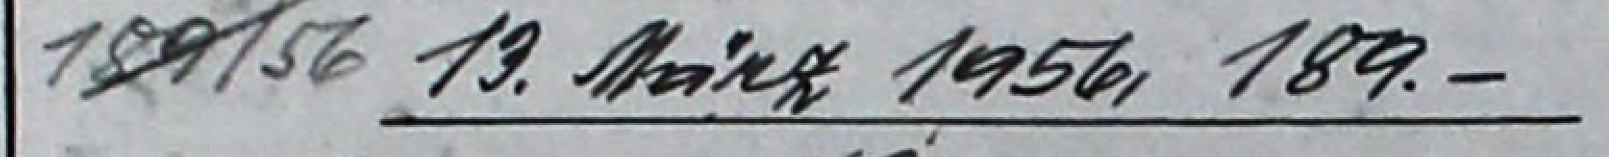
189/56 13. März 1956, 189.-
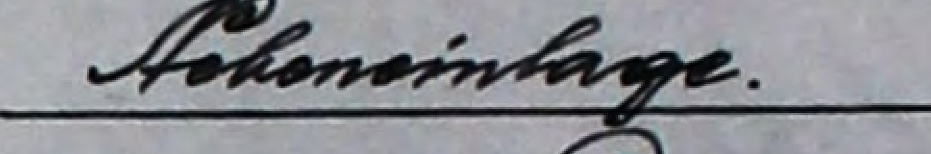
Nebeneinlage.
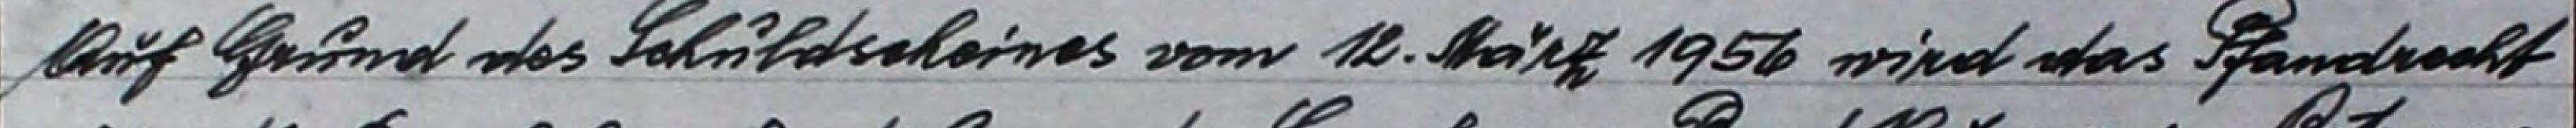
Auf Grund des Schuldscheines vom 12. März 1956 wird das Pfandrecht
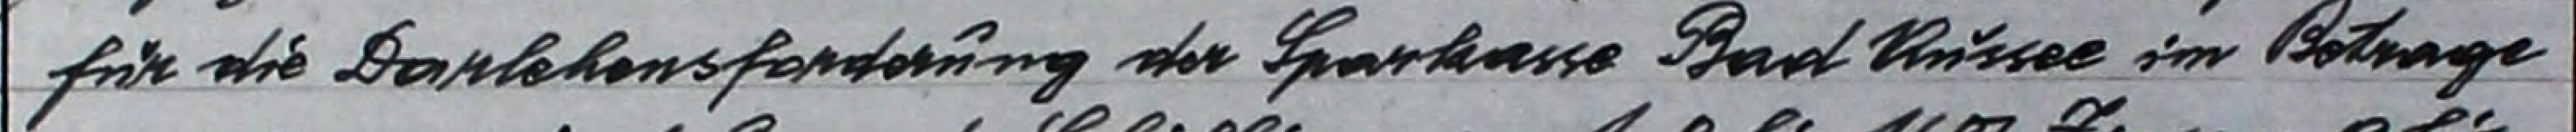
für die Darlehensforderung der Sparhausse Bad Aussee im Betrage
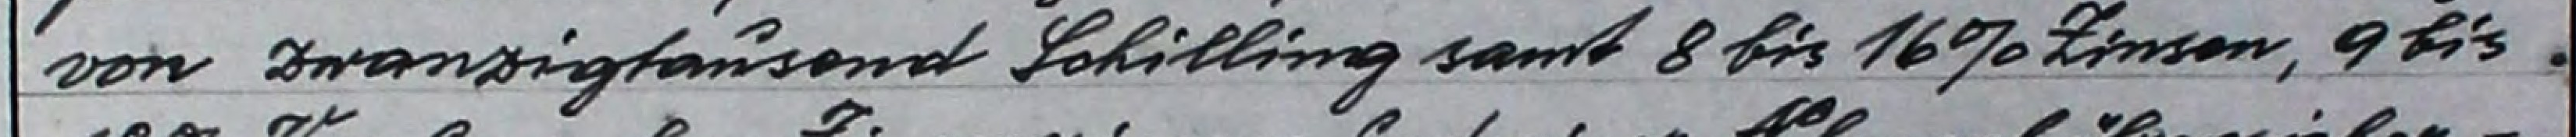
von Zwanzigtausend Schilling samt 8 bis 16% Zinsen, 9 bis
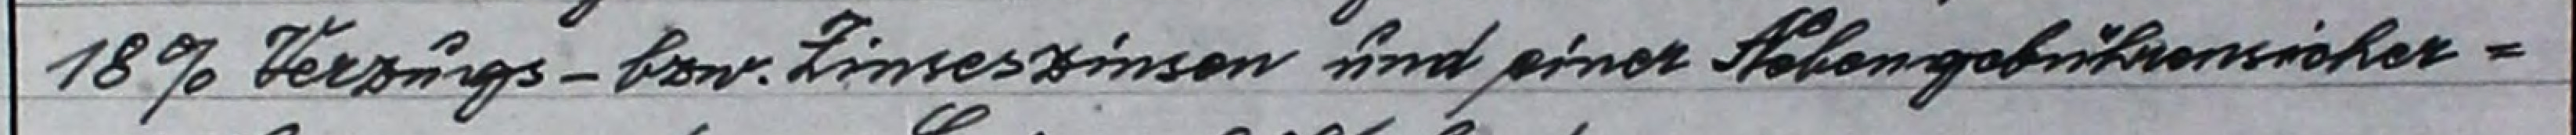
18% Verzugs - bzw. Zinseszinsen und einer Nebengebührensicher=
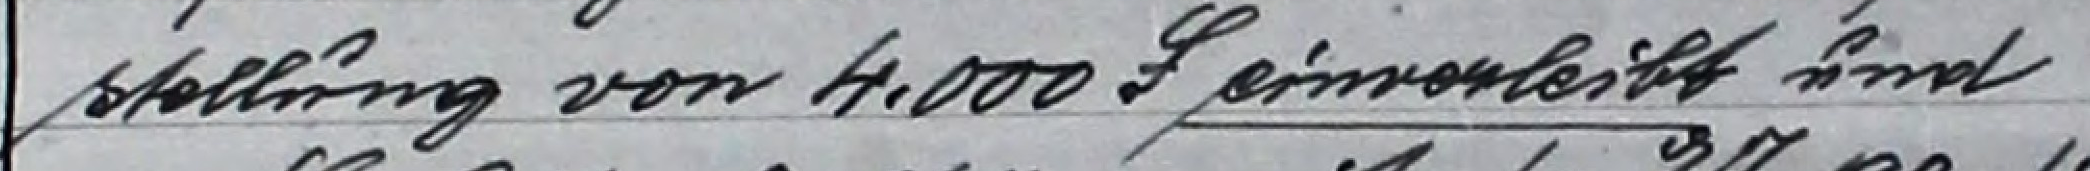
stellung von 4.000 F einverleibt und
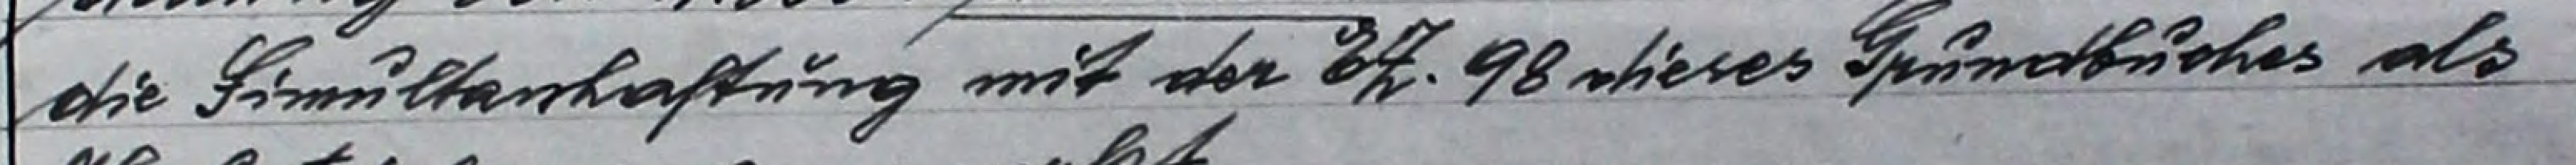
die Simultanhaftung mit der EZ. 98 dieses Grundbuches als
